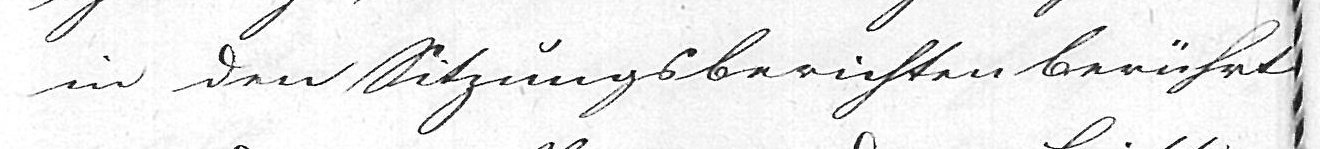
in den Sitzungsberichten berührt
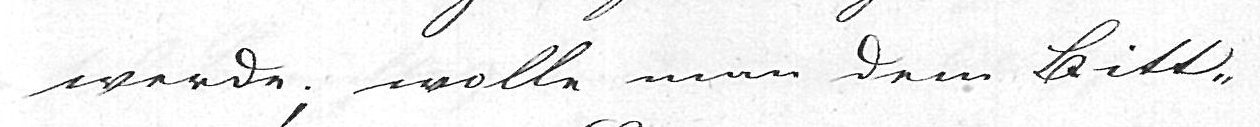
werde, wolle man dem Bitt-
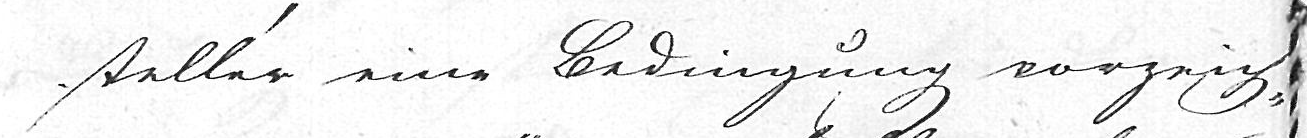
steller eine Bedingung vorzeich-
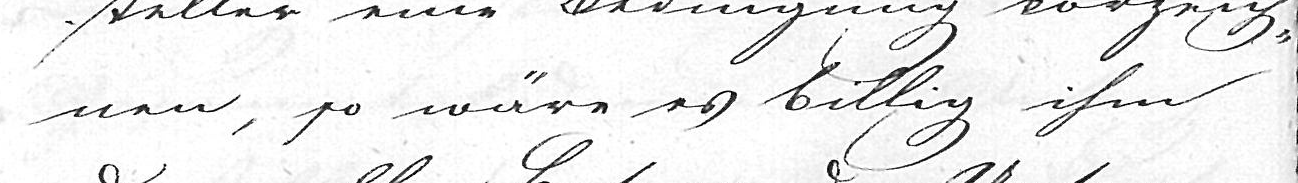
nen, so wäre es billig, ihm
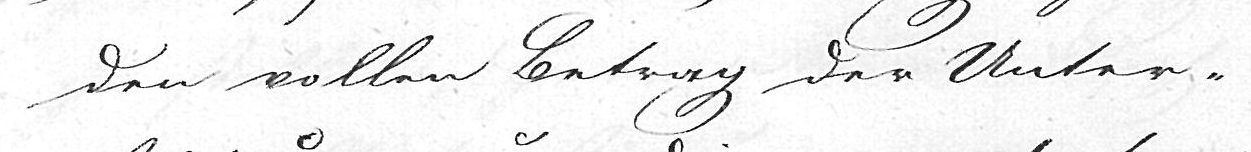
den vollem Betrag der Unter-
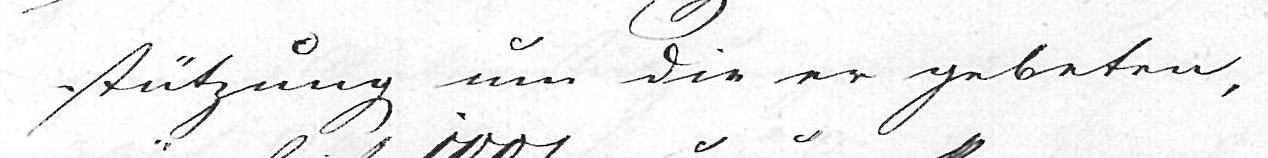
stützung um die er gebeten
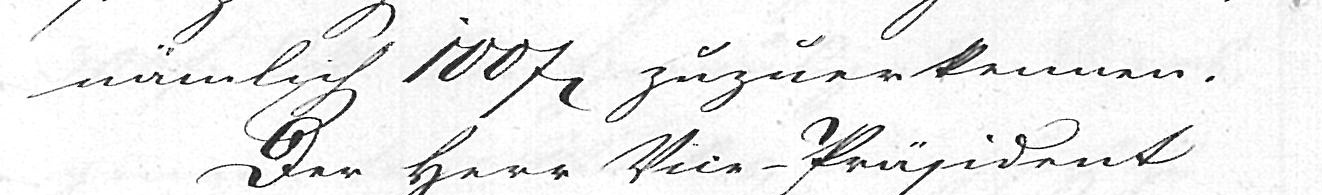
nämlich 100 fr. zuzuerkennen.
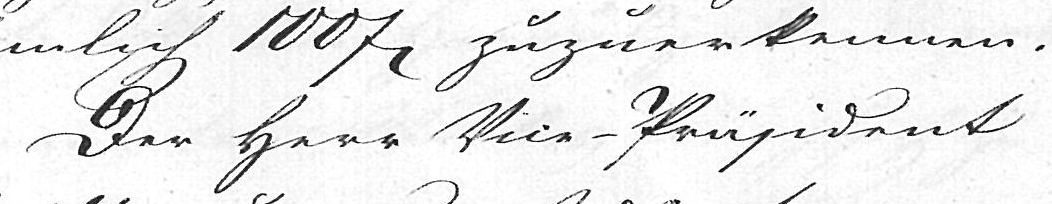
Der Herr Vice-Präsident
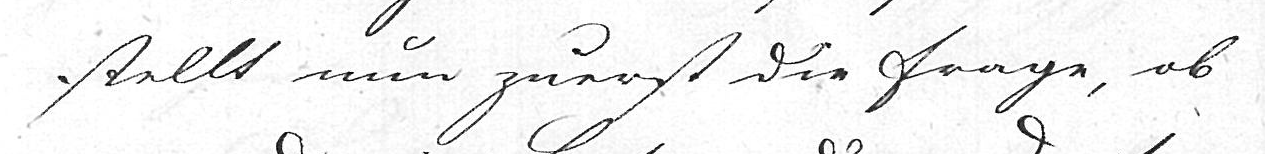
stellt nun zuerst die Frage, ob
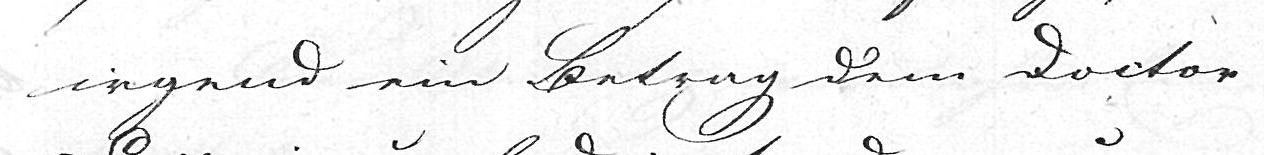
irgend ein Betrag dem Doctor
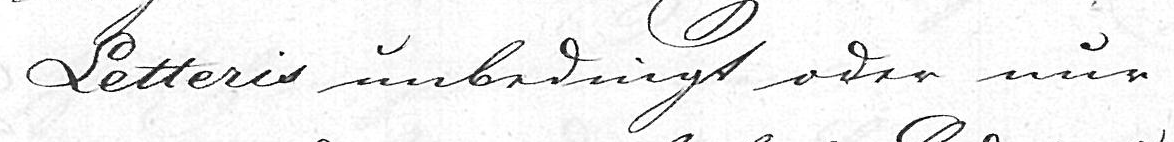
Letteris unbedingt oder nur
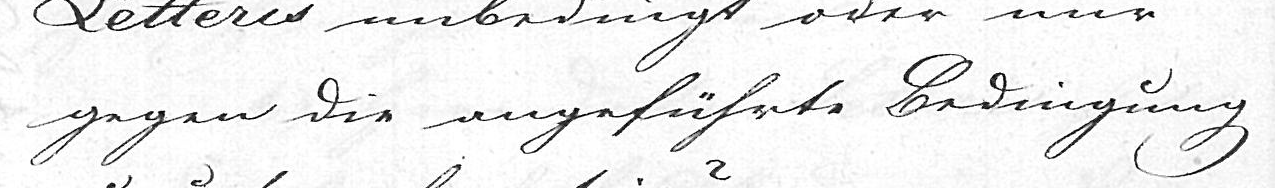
gegen die angeführte Bedingung
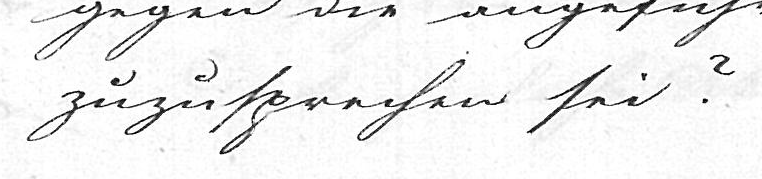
zuzusprechen sei?
